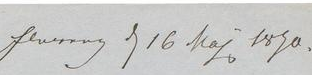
Florenz den 16 Maj 1870.
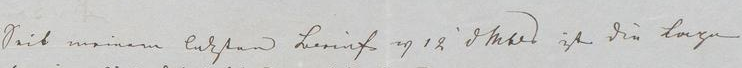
Seit meinem letzten Brief vom 12t dMts ist die Lage
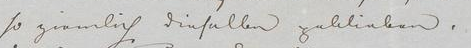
so ziemlich dieselbe geblieben. –
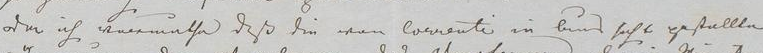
Da ich vermuthe daß die von Correnti in Aussicht gestellte
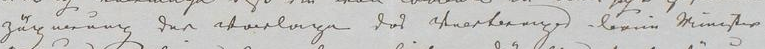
Zögerung der Vorlage des Vertrags beim Minister
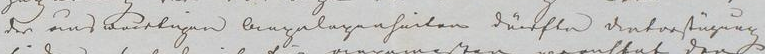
der auswärtigen Angelegenheiten dürfte Unterstüzung
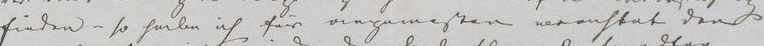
finden – so habe ich für angemeßen erachtet den
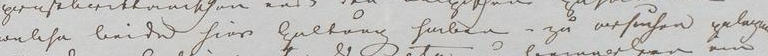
welche beide hier Geltung haben – zu ersuchen gelegent-
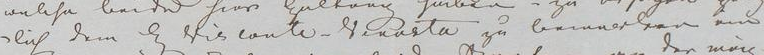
lich dem Herrn Visconti-Venosta zu bemerken ein
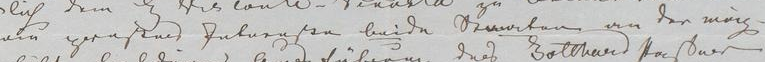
wie großes Intereße beide Staaten an der mög-
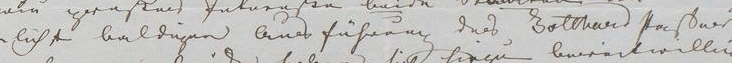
lichst baldigen Ausführung des Gotthard Paßes
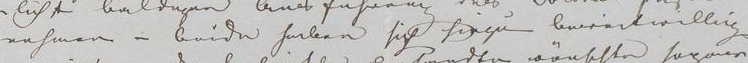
nehmen – beide haben sich hiezu bereitwillig
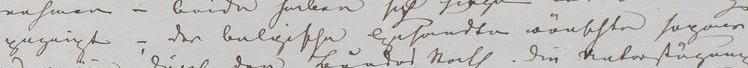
gezeigt – der belgische Gesandte wünschte sogar
